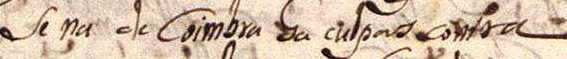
se na de Coimbra ha culpas contra
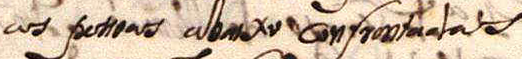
as pessoas abaixo confrontadas
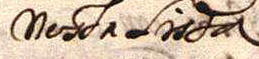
nesta Lista
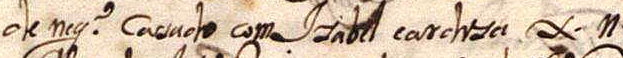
de neg.o casado com Izabel cardoza x. n.
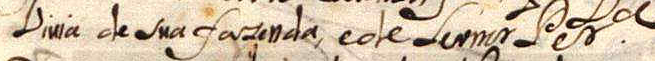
Viuia de sua fazenda, e de Leonor Per.a
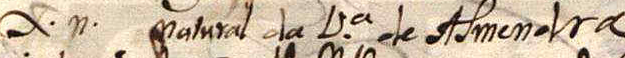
X. n. natural da V.a de Almendra
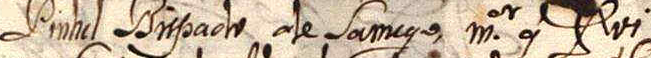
Pinhel Bispado de Lamego, m.or q̄ foi
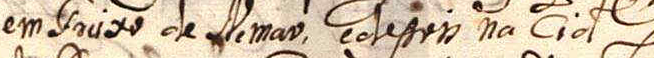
em Freixo de Nemaõ. e depois na Cid̄e
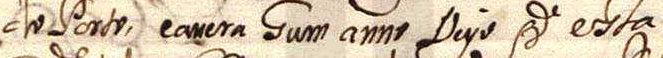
do Porto, e auera hum anno Veyo pa esta
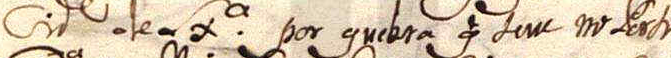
Cide de Lxa. por quebra q̄ teue no Porto
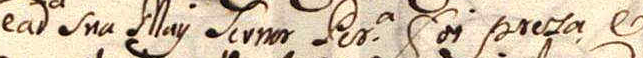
e a da sua May Leonor Per.a foi preza, e
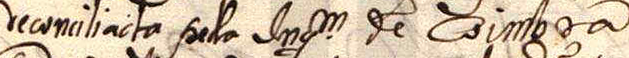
reconciliada pela Inq.m de Coimbra
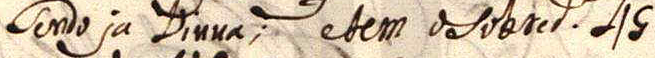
sendo ja Viuua; e tem o sobred.o 45.
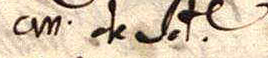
an. de Id̄.e
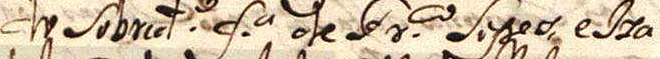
do sobred̄.o f.a de Fr.co Lopes, e Iza
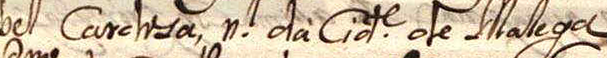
bel Cardosa, n.l da Cid̄.e de Malega
